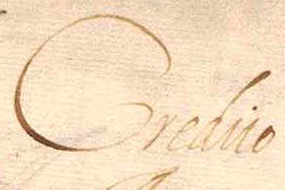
Credito
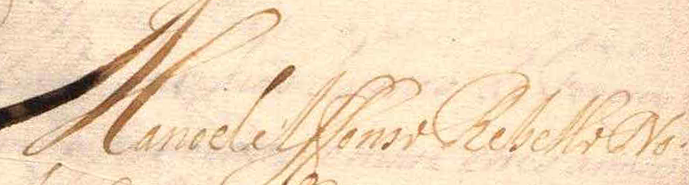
Manoel Affonso Rebello No
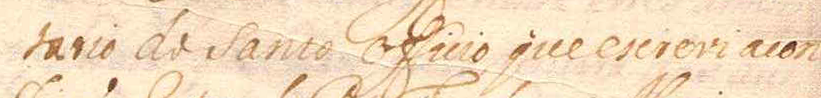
tario do Santo officio, que escrevi a con
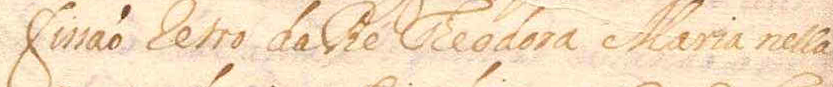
fissaõ Retro da Ré Theodora Maria nella
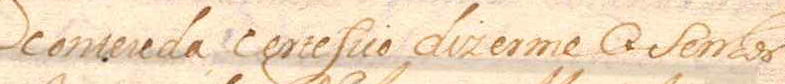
conteuda certefico dizerme o Senhor
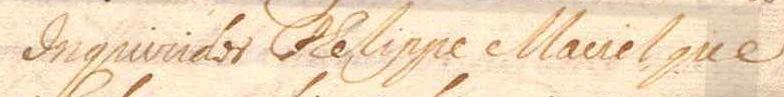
Inquizidor Phelippe Maciel, que
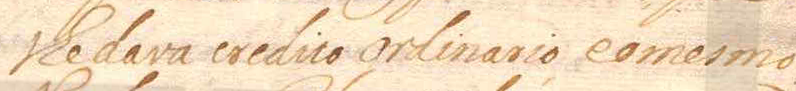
lhe dava credito ordinario, e o mesmo
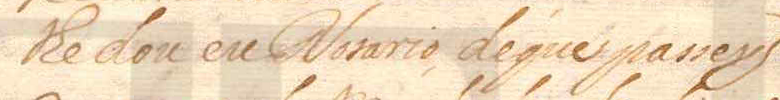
lhe dou eu Notario, de que passey
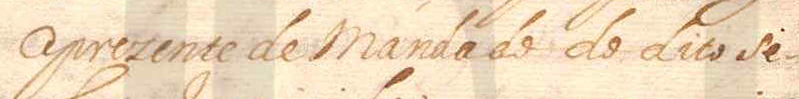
a prezente de Mandado do dito se
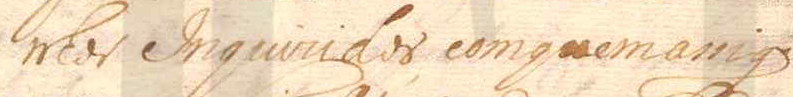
nhor Inquizidor, com quem assig
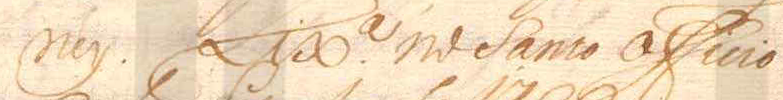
ney. Lxa no Santo officio
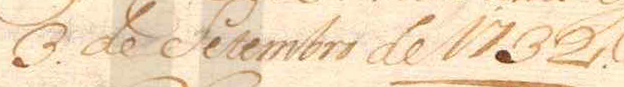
3 de Setembro de 1732.
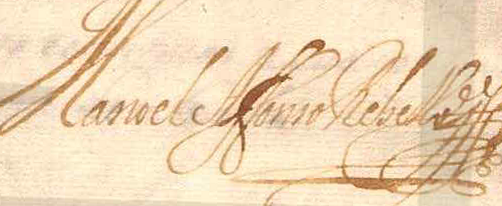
Manoel Affonso Rebello
